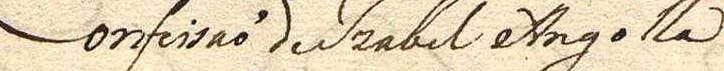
Confisaõ de Izabel Angolla.
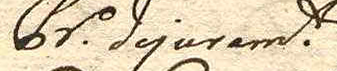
Tr.o de juram.to
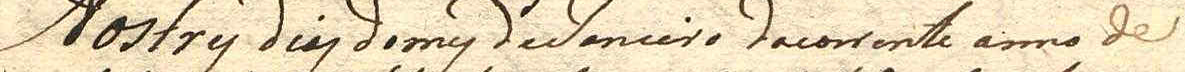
Aos tres dias do mes de Ianeiro do corrente anno de
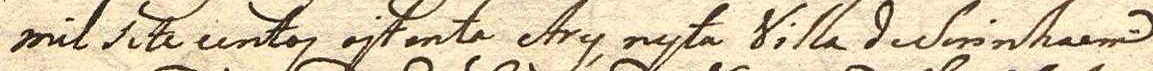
mil setecentos ojtenta e tres, nesta Villa de Serinhaem
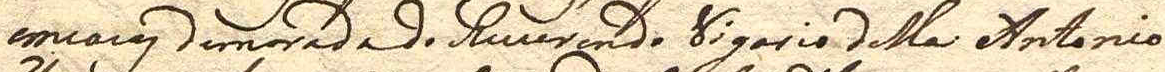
em cazas de morada do Reuerendo Vigario della Antonio
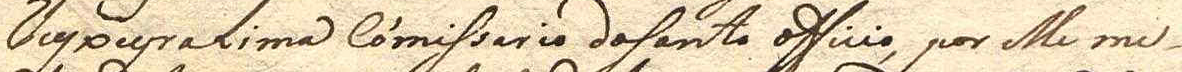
Teyxeyra Lima Cōmissario do santo officio, por elle me
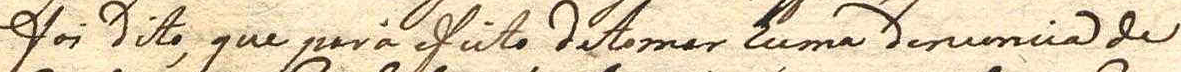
foi dito, que para efeito de tomar huma denuncia de
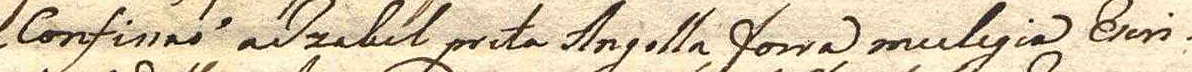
confissaõ a Izabel preta Angolla, forra, me elegia Escri
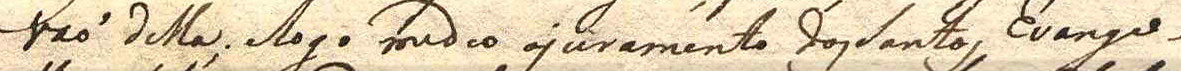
vaõ della, e logo me deo o juramento dos santos Evange
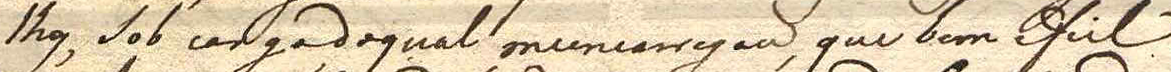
lhos, sob cargo do qual me encarregou, que bem e feil
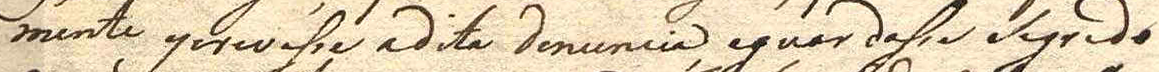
mente escrevesse a dita Denuncia, e guardasse segredo
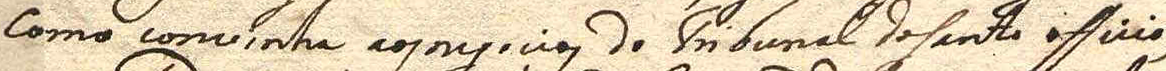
como convinha aos negocios do Tribunal do santo officio,
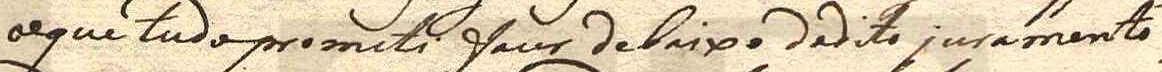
ao que tudo prometi fazer debaixo do dito juramento
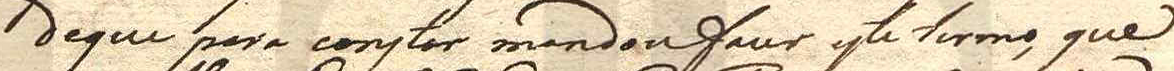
de que para constar mandou fazer este termo, que
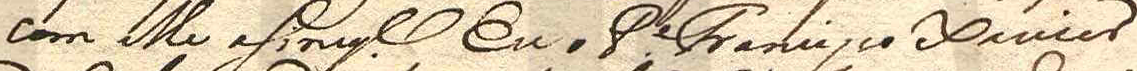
com elle asiney. Eu o P.e Francisco Xavier
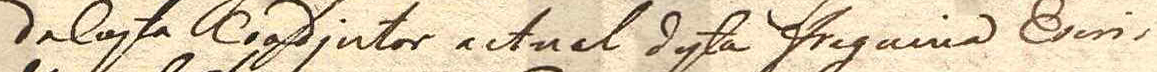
da Costa Coadjutor actual desta freguezia Escri
